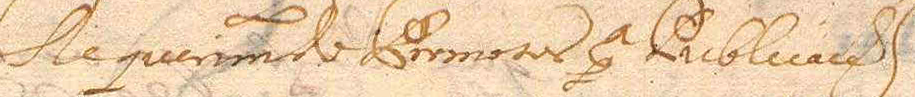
Requerimto do Promotor p.a Publicaçaõ
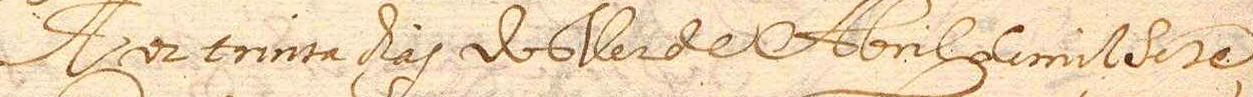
Aos trinta dias do Mez de Abril de mil sete
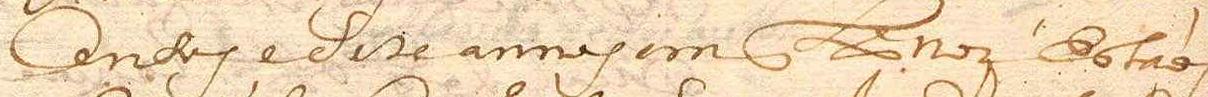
Centos, e sete annos em Lxa nos Estaos
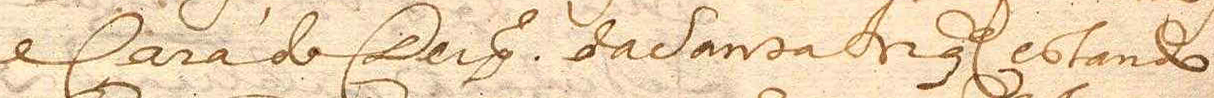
e Caza do Desp.o da Santa Inq.caõ estando
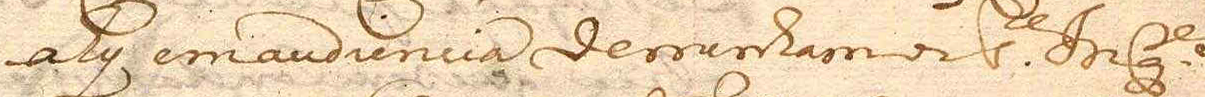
ahy em audiencia de menham os s.res Inq.res
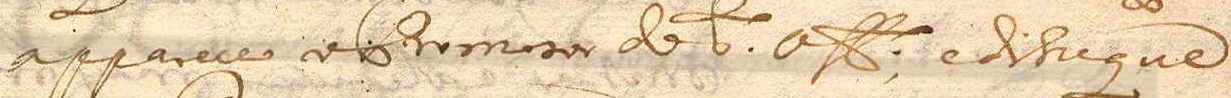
appareceo o Promotor do s.to Off.o, e disse que
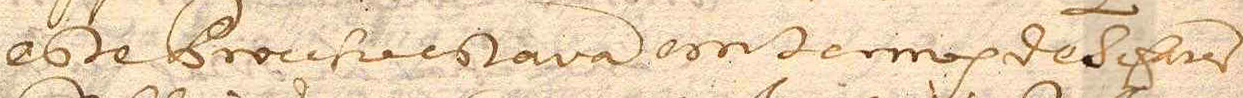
este Processo estava em termos de se fazer
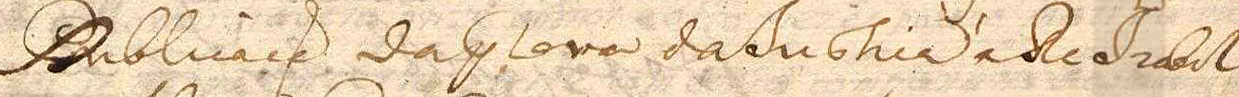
Publicaçaõ da prova da Justiça à Re Izabel
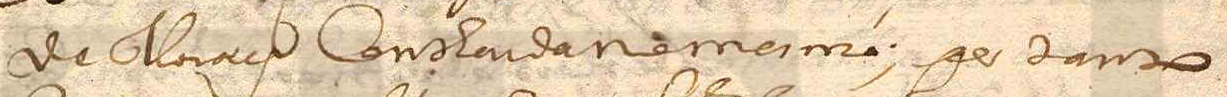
de Moraes Contheuda no mesmo; per tanto
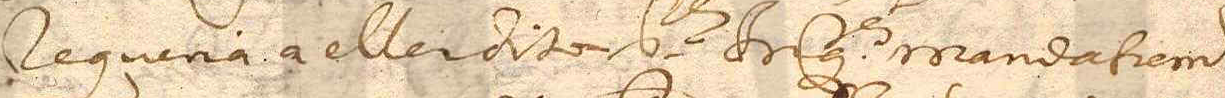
Requeria a elles ditos s.res Inq.res mandassem
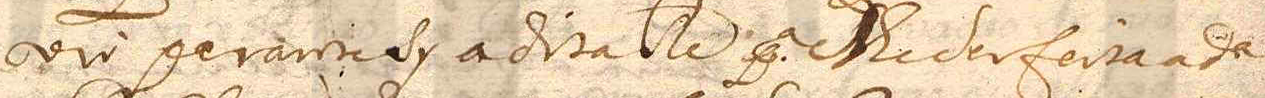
vir perante sy a dita Re p.a lhe ser feita a d.a
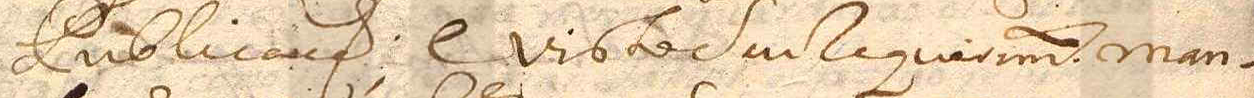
Publicaçaõ, e visto Seu Requerim.to man
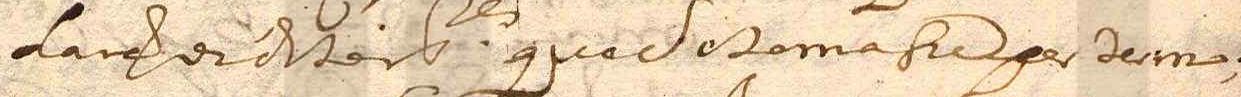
daraõ os ditos s.res que se tomasse por termo;
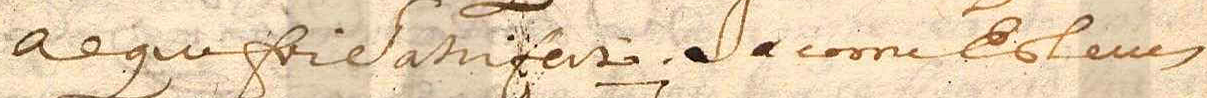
ao que foi satisfeito. Iacome Esteues
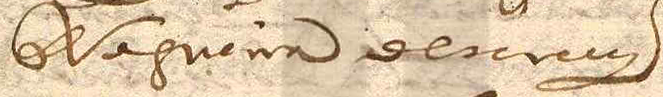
Nogueira o escreuj
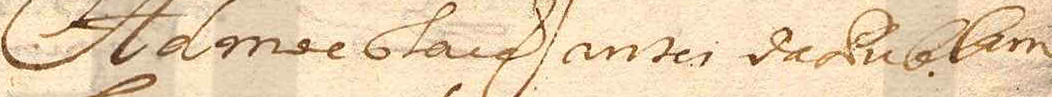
Admoestaçaõ antes da Pub.Cam
